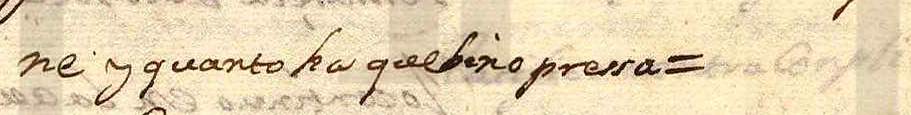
ne y quanto ha que bino pressa
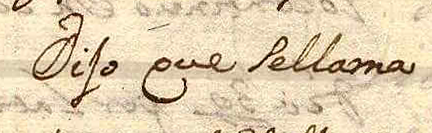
Dijo que se llama
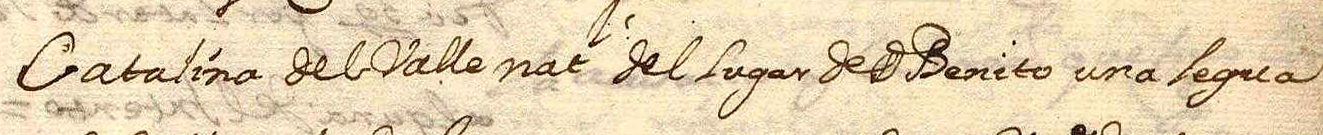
Catalina del Valle natl del Lugar de S. Benito una legua
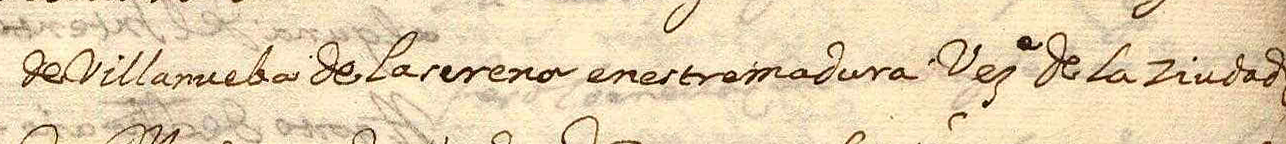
de Villa nueba de la serena en estremadura Veza de la ziudad
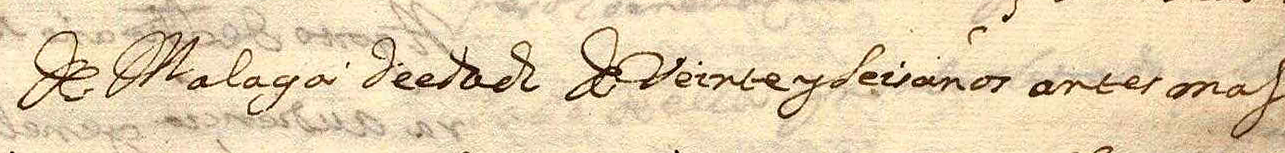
de Malaca de edad de veinte y seis an̄os antes mas
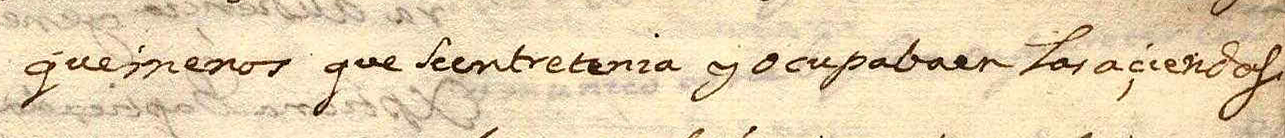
que menos que se entretenia y ocupaba en las aciendas
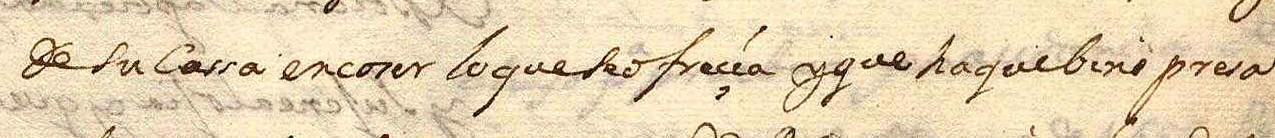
de su cassa encoser o que se ofrecia y que ha que bino presa
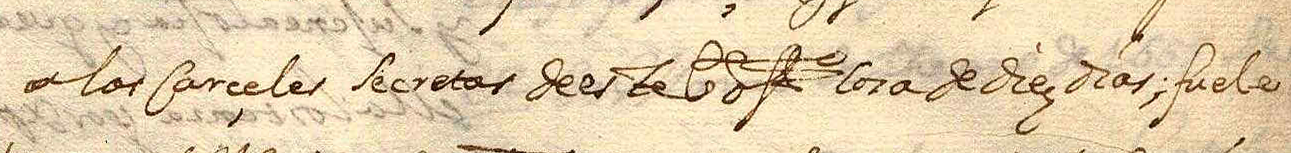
a las Carceles secretas de este sto offo cosa de diez dias, fuele
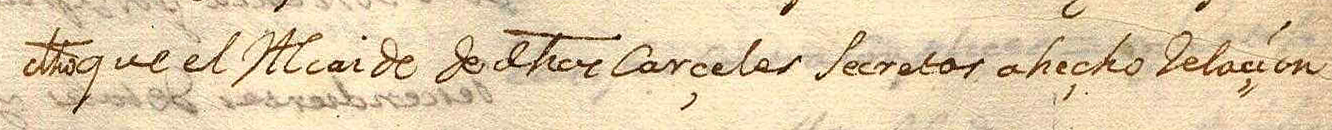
dh̄o que el Alcaide de dh̄os Carceles Secretos a hecho Relacion
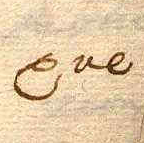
que
